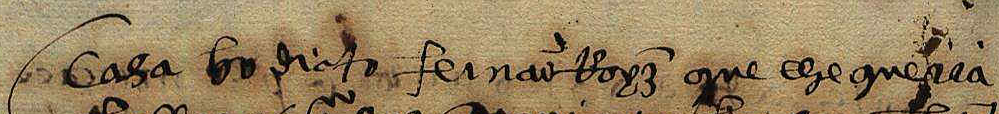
casa ho dicto fernaõ Royz̄ que lhe queria
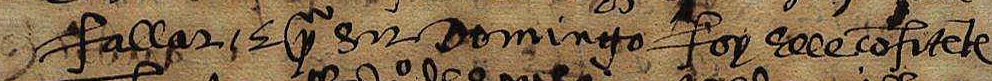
fallar / E p̄o ser Domingo foy Elle cōfitēte
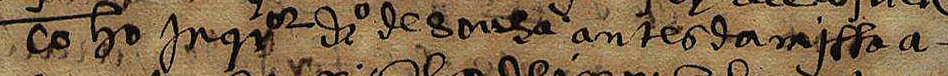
c̄o ho Jnquor dio de sousa antes da mjssa a
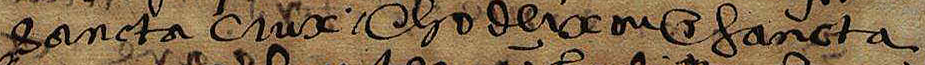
sancta crux / e ho deixou ē sancta
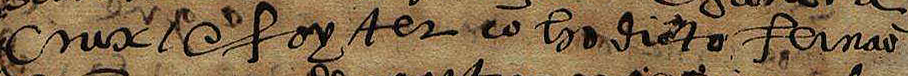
Crux / e foy ter cō ho dicto fernaõ
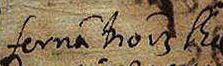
fernā Roīz lhe
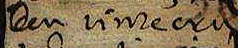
deu vinte cru
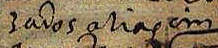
zados alias cin
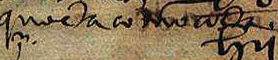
quoēta como cōsta
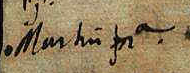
Martim pra.
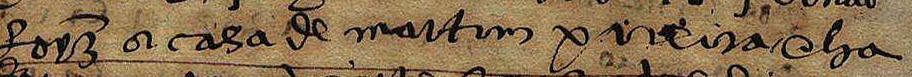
Roȳz a casa de martim pireira, e ha
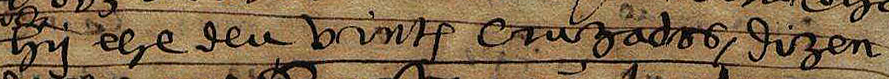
hij lhe deu vintꝭ cruzados, dizen
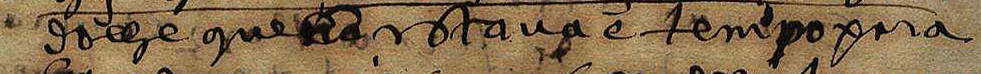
dolhe que nā estaua ē tempo pera
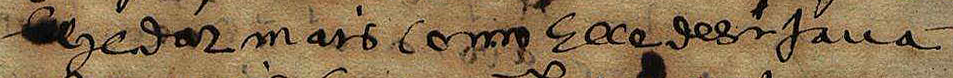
lhe dar mais como Elle deseJaua
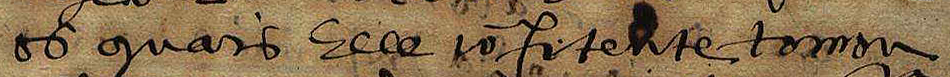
os quais Elle cōfitente tomou
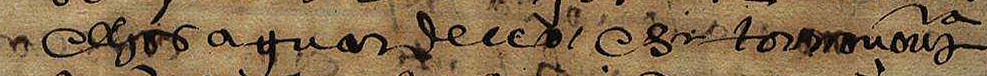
e lhos aguardeceo / e se tornou outra
